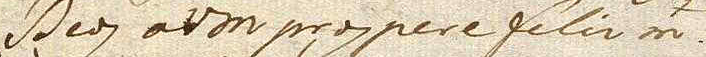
Deos a vm prospere felizm.te
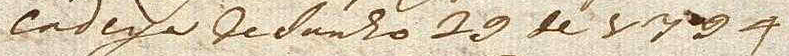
cadeya de Iunho 29 de 1794
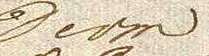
De vm
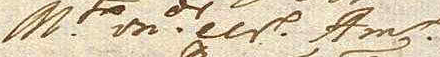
M.to vn.or e cr.o Am.o
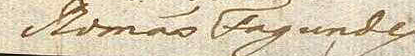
Romão Fagundes
